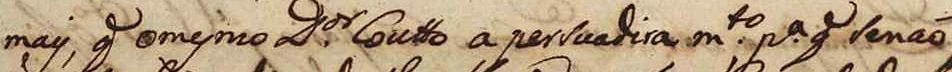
mais, q̄ o mesmo D.or Coutto a persuadira m.to, p.a q̄ senaõ
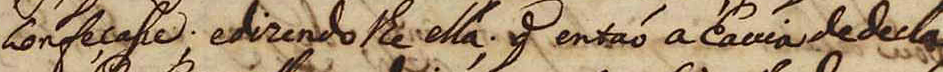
confeçasse; e dizendo lhe ella; q̄ entaõ a havia de decla
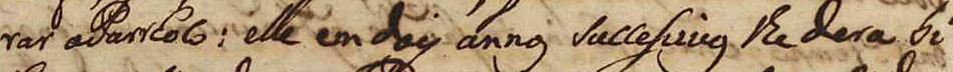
rar o Parrhoco: elle em dois annos successivos lhe dera bi
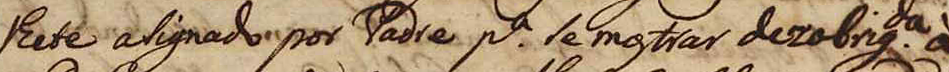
lhete asignado por Padre p.a se mostrar dezobrig.da à
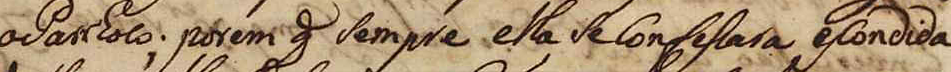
o Parrhoco; porem q̄ sempre ella se confessara escondida
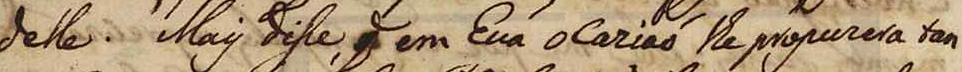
delle. Mais disse, q̄ em huā ocaziaõ lhe propuzera tan
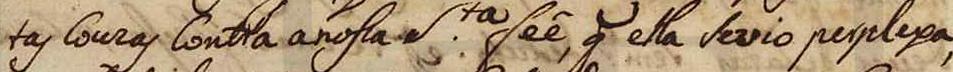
tas couzas contra a nossa S.ta feé, q̄ ella se vio perplexa,
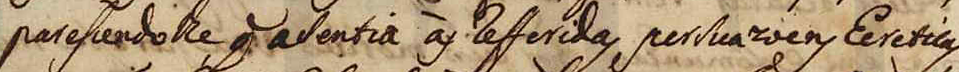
paressendolhe, q̄ asentia às Refferidas persuzaoens hereticas.
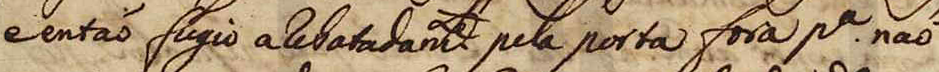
e entaõ fugio aRebatadamte pela porta fora p.a naõ
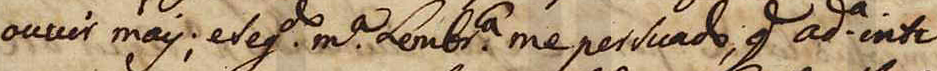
ouuir mais; e seg.do m.a Lembr.ca me persuado, q̄ a d.a inti
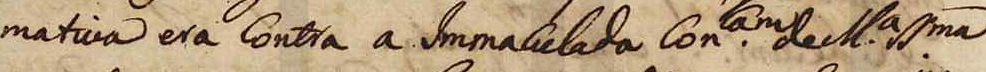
matiua era contra a Immaculada Con.cam de M.a ss.ma
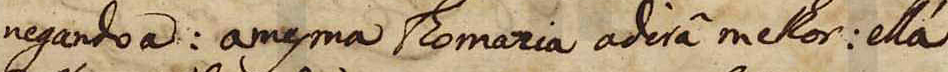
negando a: a mesma Thomazia a dirá melhor: ellá
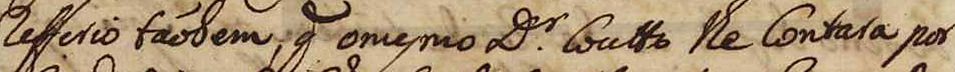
Refferio taõbem, q̄ o mesmo D.r Coutto lhe Contara por
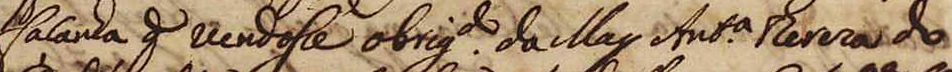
façanha q̄ vendosse obrig.do da May Ant.a Thereza do
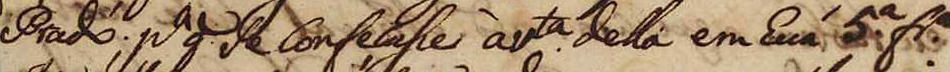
Prado; pa q̄ se confeçasse à v.ta della em huā 5.a fr.a
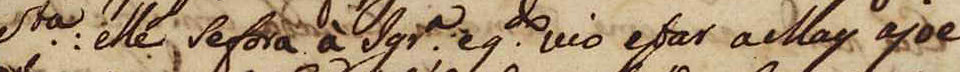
st.a: elle se fora à Igr.a; e q.do uio estar a May ajoe
